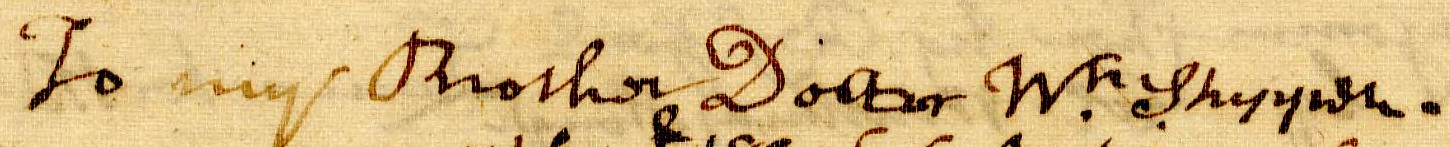To my Brother Doctor W^m. Shippen-
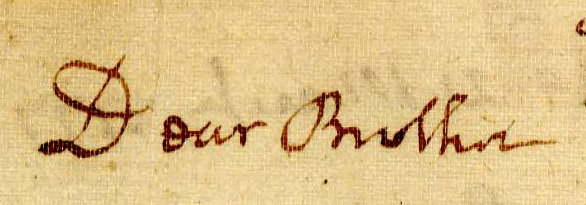Dear Brother
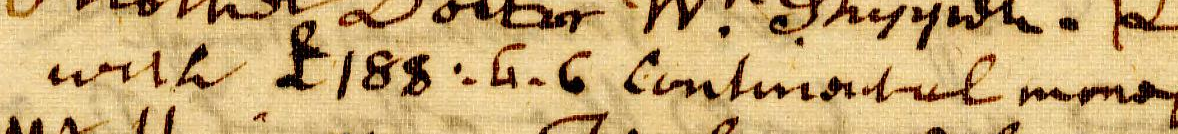with £188:4.6 Continental money
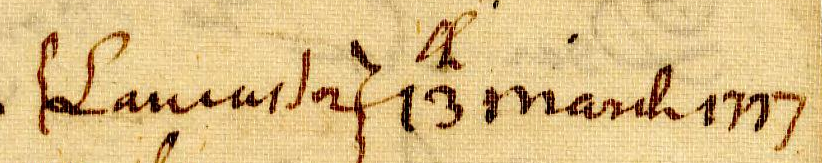Lancaster 13^th March 1777
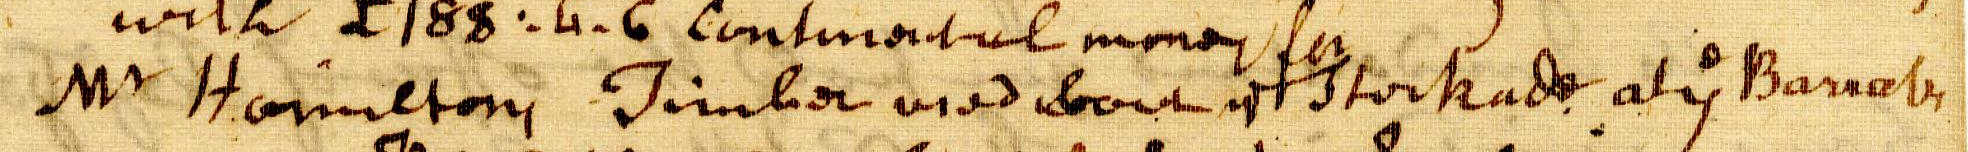M^r Hamiltons Timber used sown y^e Stockade at y^e Barrabs
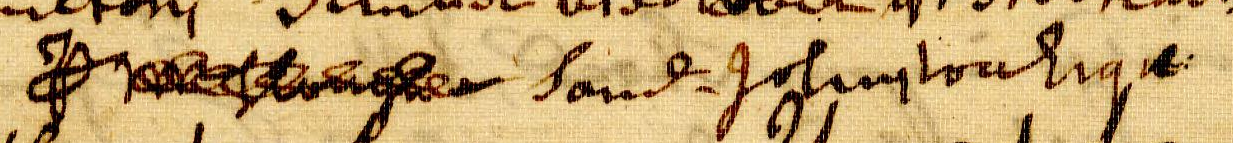per [________] Saml -J Johnston Esq^r.
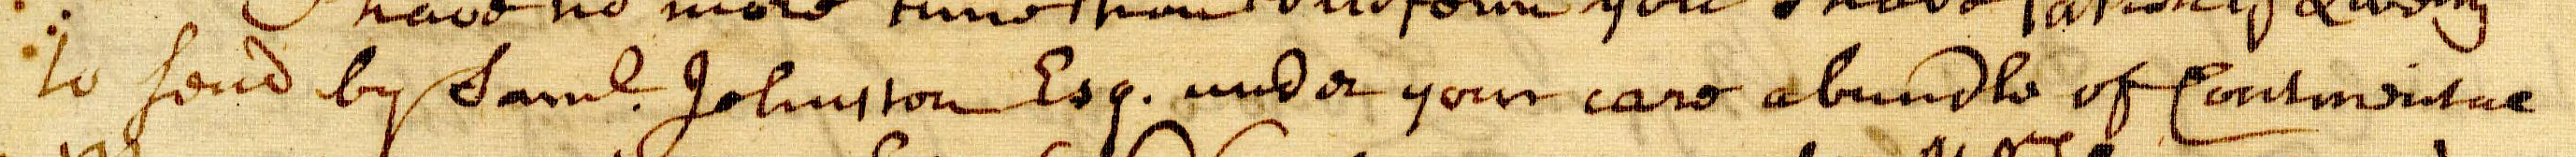to send by Sam^l. Johnston Esq. under your care a bundle of Continental
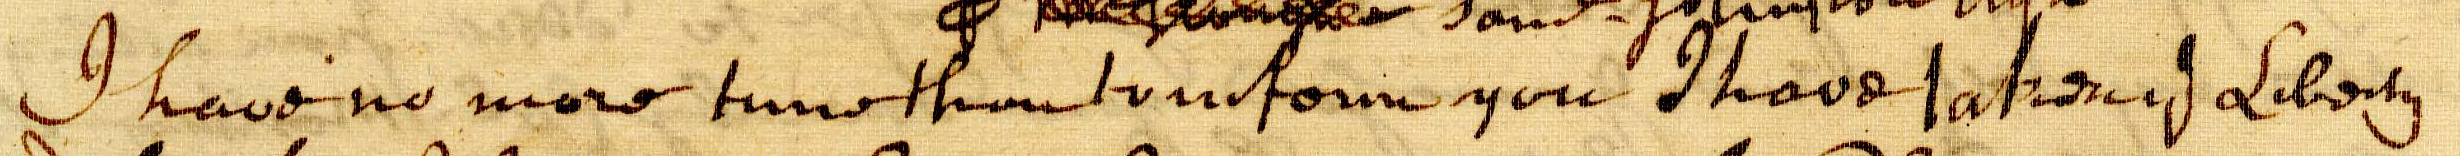I have no more time than to inform you I have taken y^e Liberty
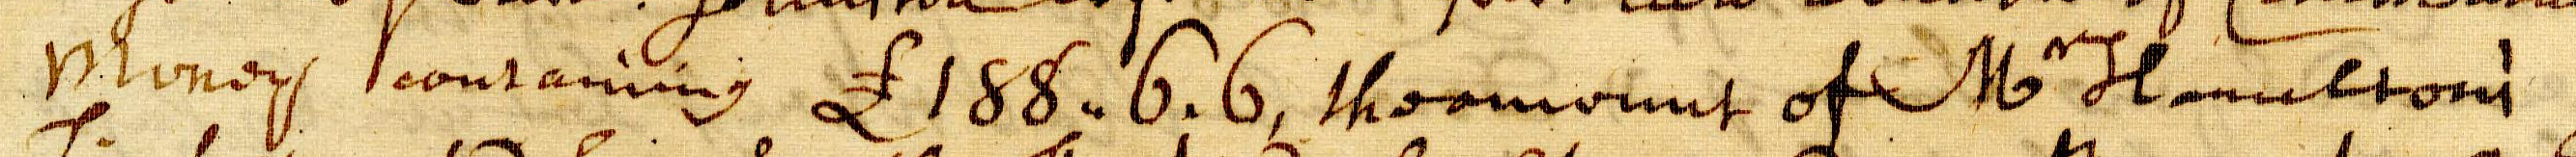Money containing £188..6.6, the amount of M^r Hamilton's
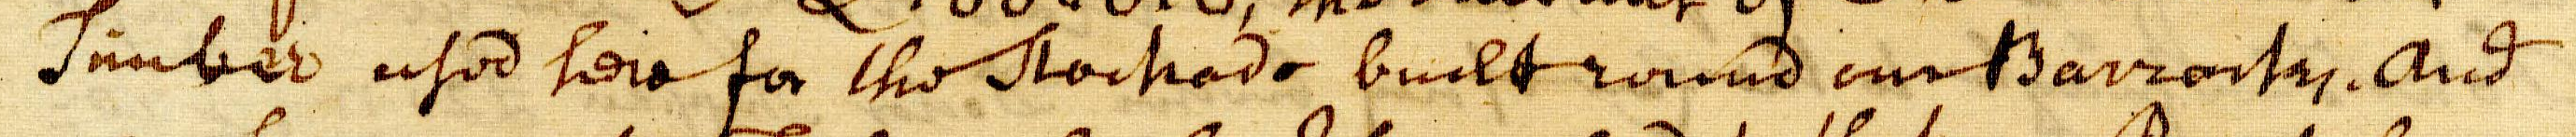Timer used here for the Stockade built round our Barracks. And
